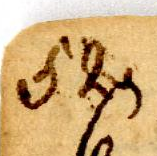52
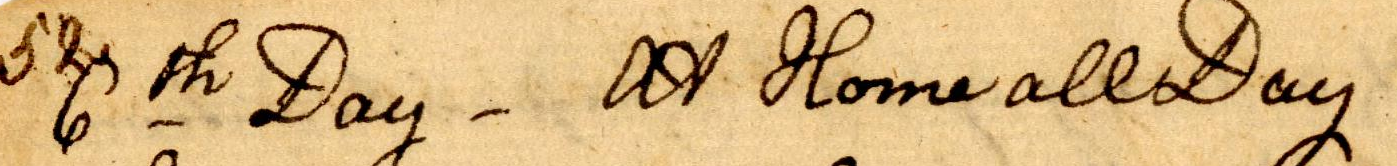6^th Day- At Home all Day
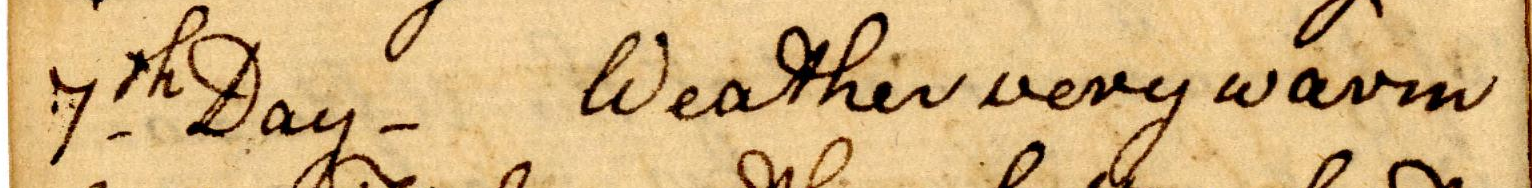7^th Day- Weather very warm
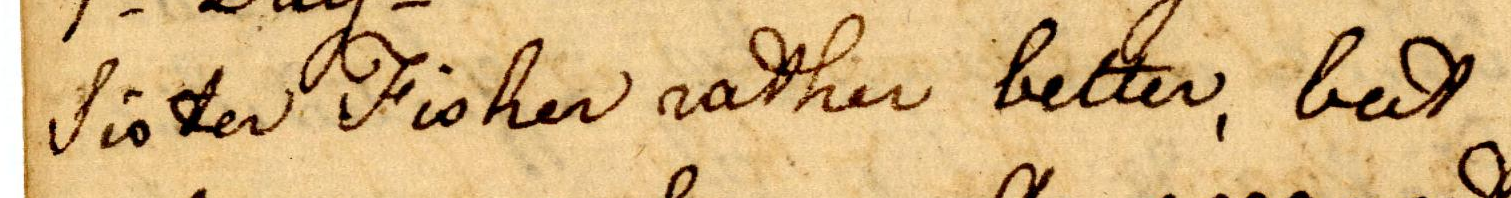Sister Fisher rather better, but
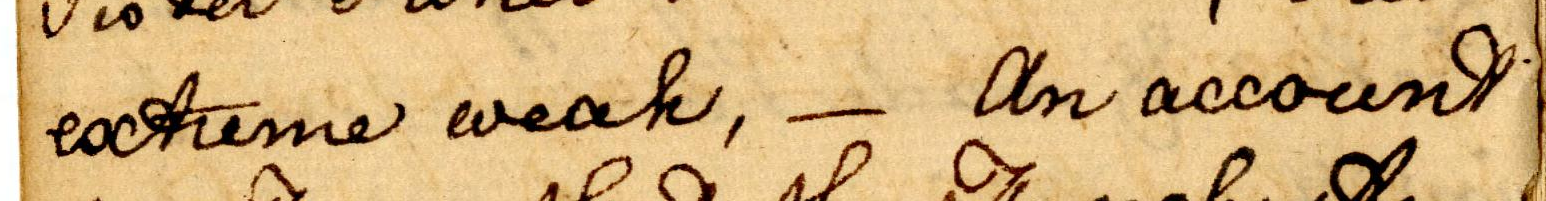extreme weak,- An account
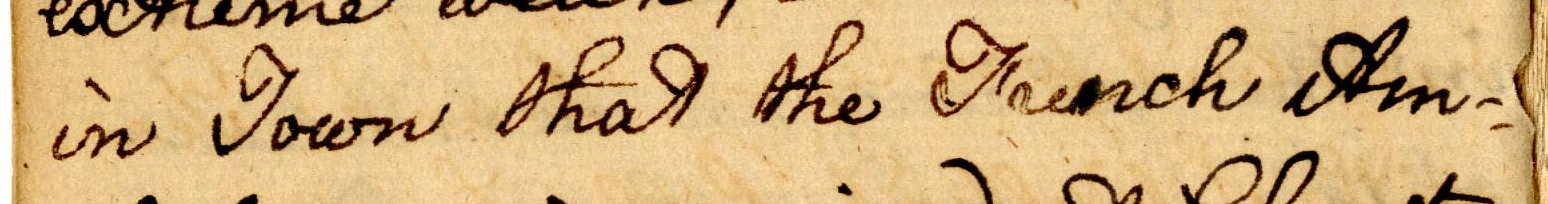in Town that the French Am-
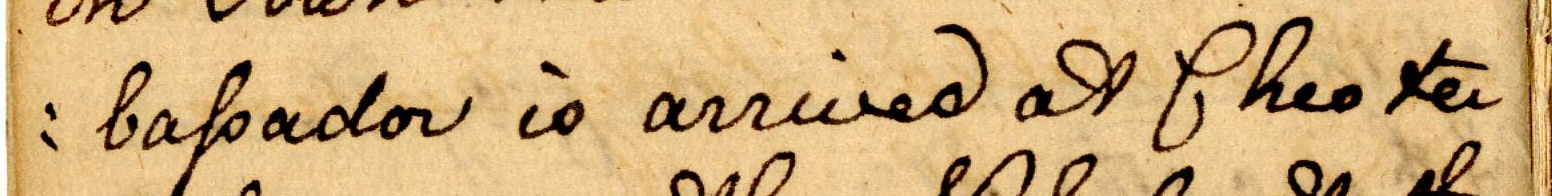-bassador is arrived at Chester
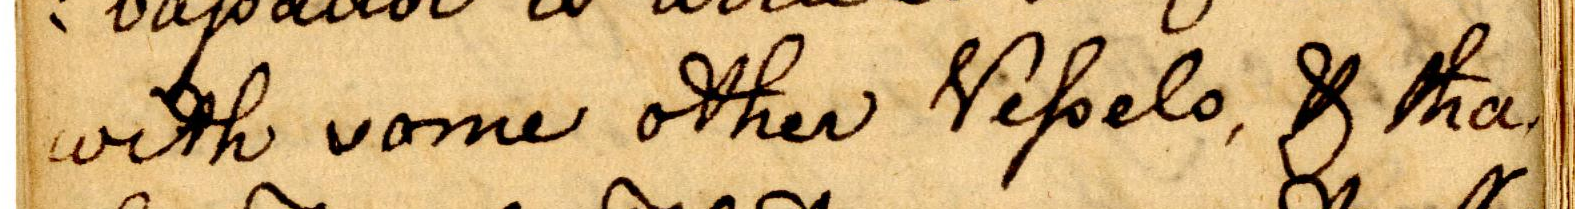with some other Vessels, & tha
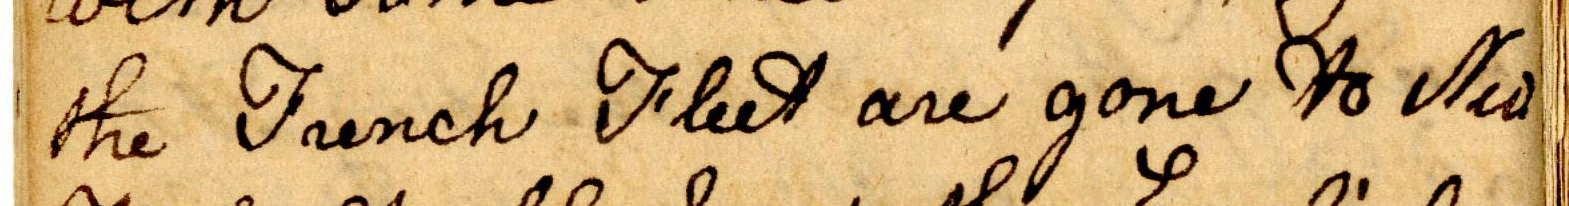the French Fleet are gone to New
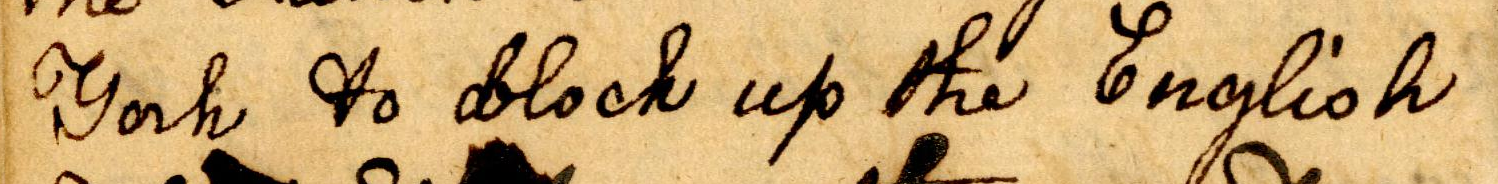York to block up the English
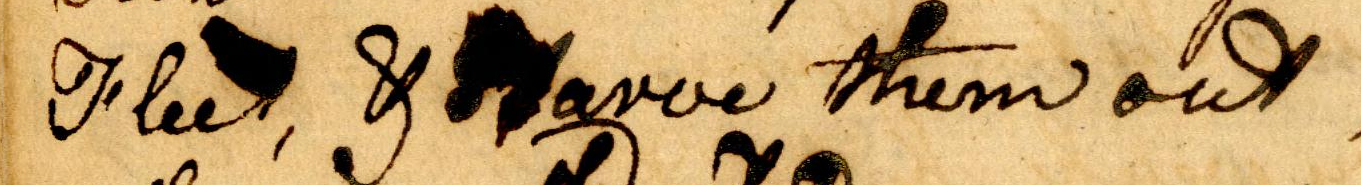Fleet, & starve them out
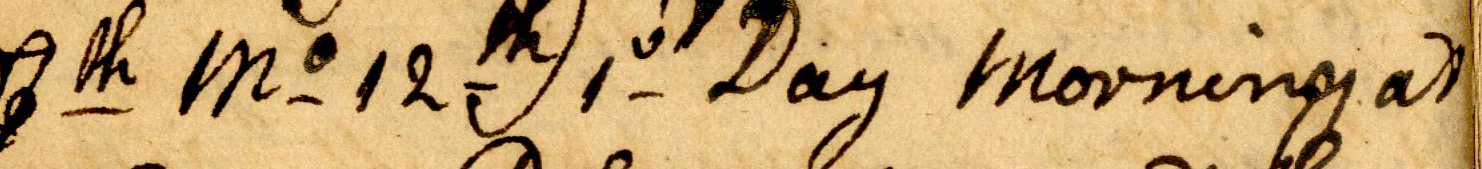6^th M^o 12^th) 1^st Day Morning at
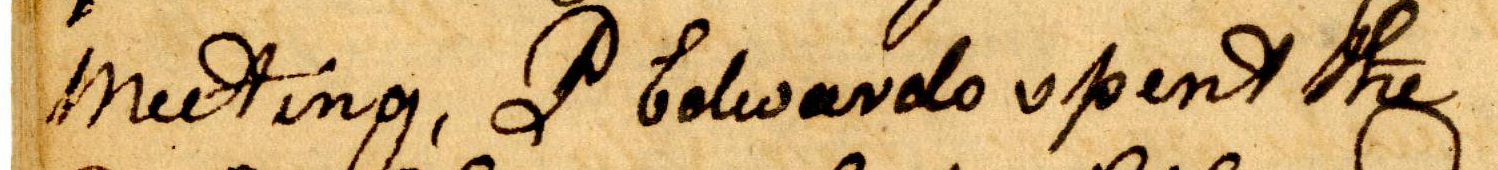Meeting, P Edwards spent the
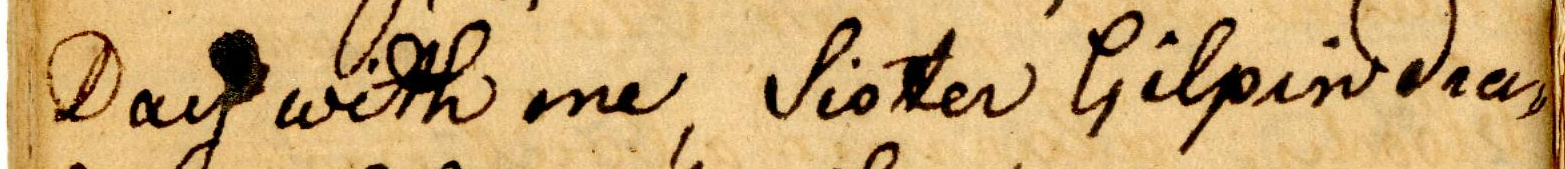Day with me, Sister Gilpin dran
